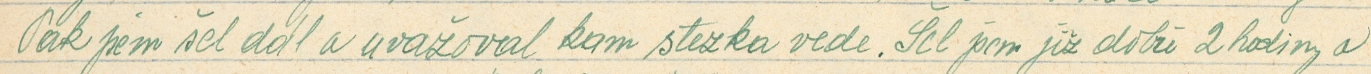Pak jsem šel dál a uvažoval kam stezka vede. Šel jsem již dobře 2 hodiny a
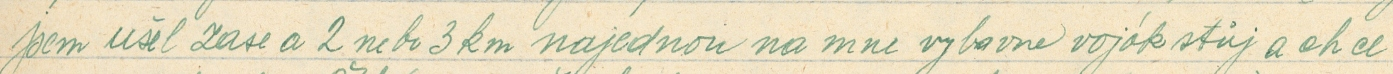jsem ušel zase a 2 nebo 3 km najednou na mne vybavne voják stůj a chce
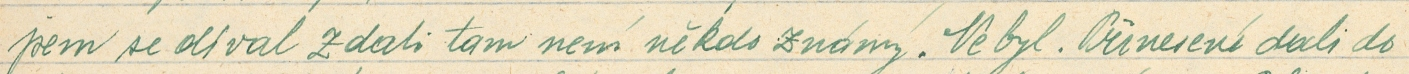jsem se díval zdali tam není někdo známý. Nebyl. Přinesené dali do
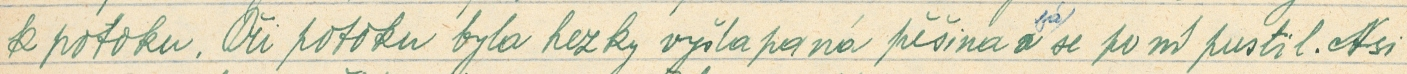k potoku. Při potoku byla hezky vyšlapaná pěšina a já se po ní pustil. Asi
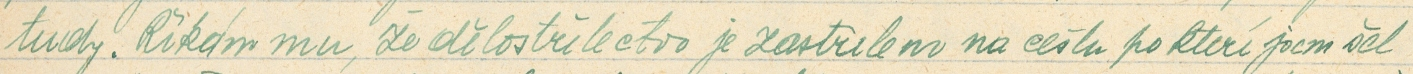tudy. Říkám mu, že dělostřelectvo je zastřeleno na cestu po které jsem šel
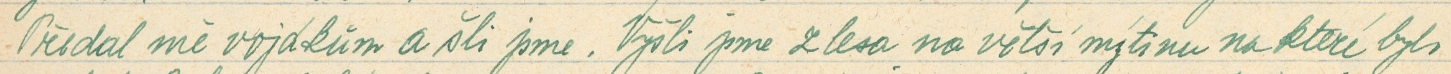Předal mě vojákům a šli jsme. Vyšli jsme z lesa na větší mýtinu na které byli
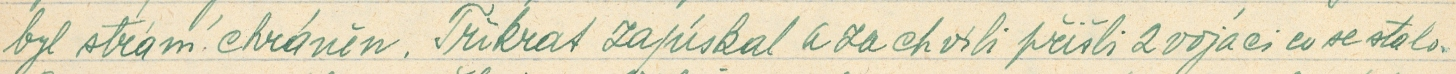byl strání chráněn. Třikrat zapískal a za chvíli přišli 2 vojáci co se stalo.
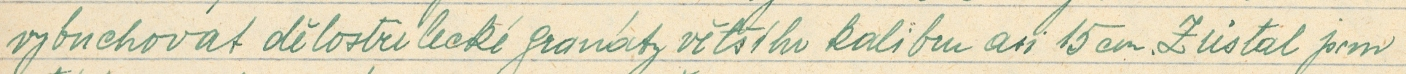vybuchovat dělostřelecké granáty většího kalibru asi 15 cm. Zůstal jsem
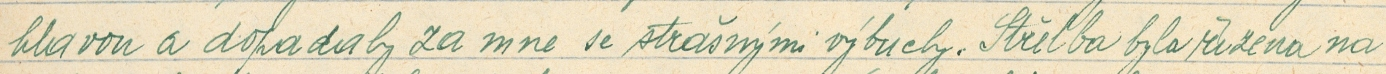hlavou a dopadaly za mne se strašnými výbuchy. Střelba byla řízena na
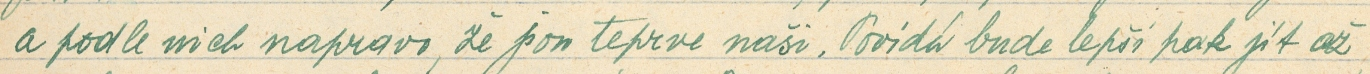a podle nich napravo, že jsou teprve naši. Povídá bude lepší pak jít až
